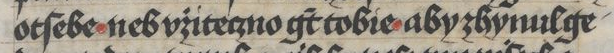otſebe.neb vżiteċno ḡt tobie.aby zhynul ge¬
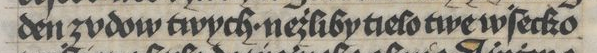den zvdow twych.neżliby tielo twe wẛecko
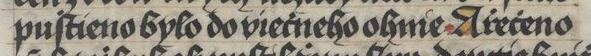puẛtieno bylo do vieċneho ohnie.A ṙeċeno
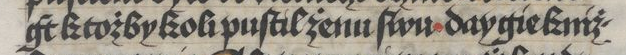ḡt ktoż by koli puſtil żenu ſwu.day gíe kníż¬
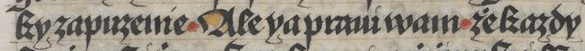ky zapuzeníe.Ale ya praui wam.że kazdy
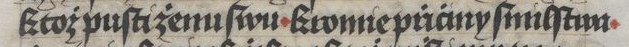ktoż puſti żenu ſwu.kromie pṙiċiny ſmiſtwa.
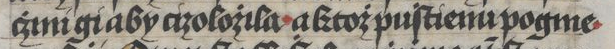cżiní gi aby cizolożila.a ktož puẛtienu pogme.
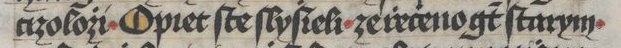cizolożí.Opiet ſte ſlyẛieli.ze ṙeċeno ḡt ſtarym.
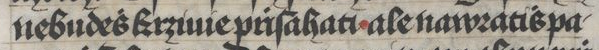nebudeṡ krziuie pṙiſahati.ale nawratiṡ pa¬
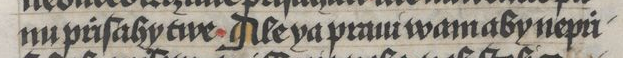nu pṙiſahy twe.Ale ya praui wam aby nepṙi¬
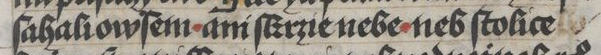ſahali owẛem.ani ſkrzie nebe.neb ſtolice
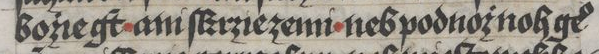bożie ḡt.ani ſkrzie zemi.neb podnoż noh geo
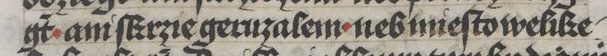ḡt ani ſkrzie geruzalem.neb mieſto welike¬
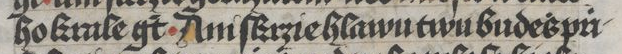ho krale ḡt.Ani ſkrzie hlawu twu budeṡ pṙi¬
